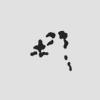邦
